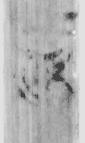{必卩}
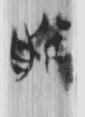朕
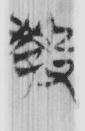教
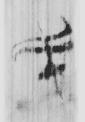民
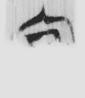朋
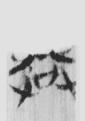興
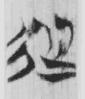從
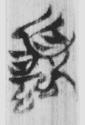顯
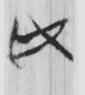女
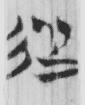從
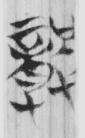{𦚏兄廾}
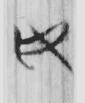女
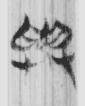與
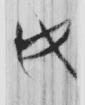女
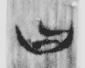曰
